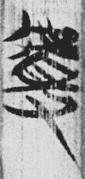{虍且又}（且）
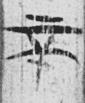不
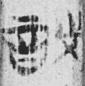{言丵}（察）
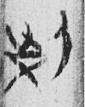死
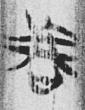者
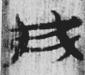弗
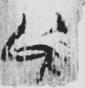收
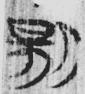○（傷）
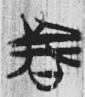者
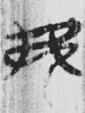弗
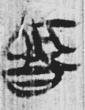䎽（問）
